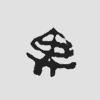思
